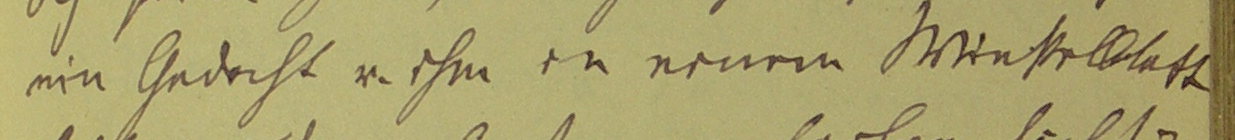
ein Gedicht von ihm in einem Winkelblatt
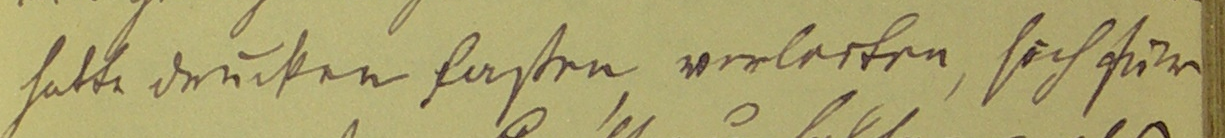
hatte drucken lassen , verleiten sich für
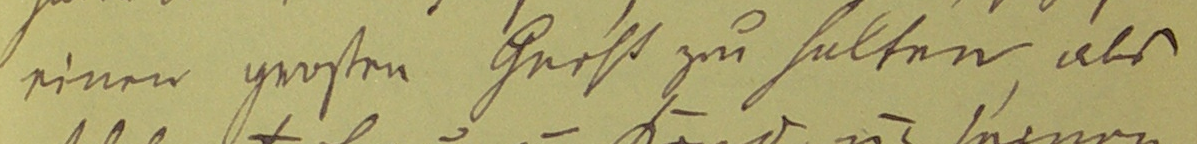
einen großen Geist zu halten, als
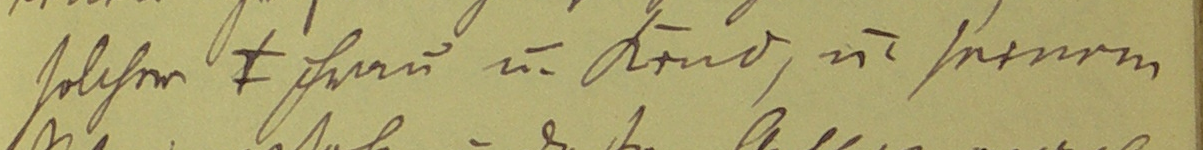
solcher mit Frau und Kind und seinem
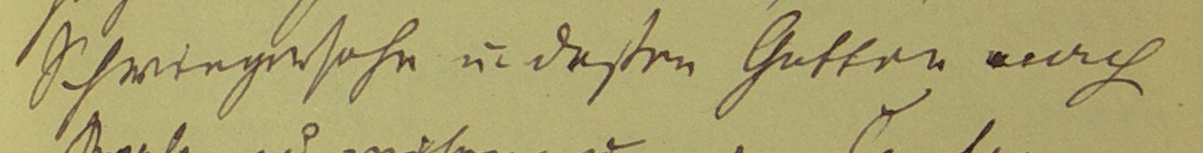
Schwiegersohn und dessen Gattin auch nach
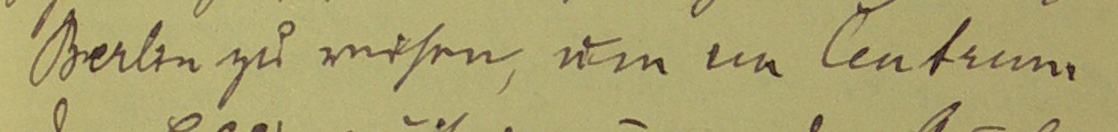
Berlin zu reisen, um im Centrum
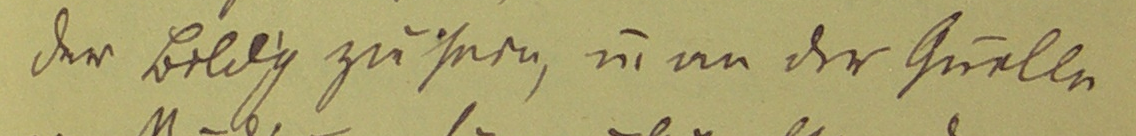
der Bildung zu sein, und an der Quelle
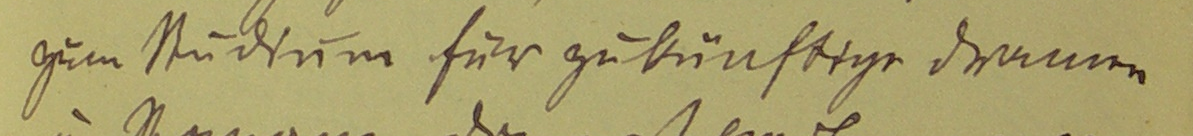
zum Studium für zukünftige Dramen
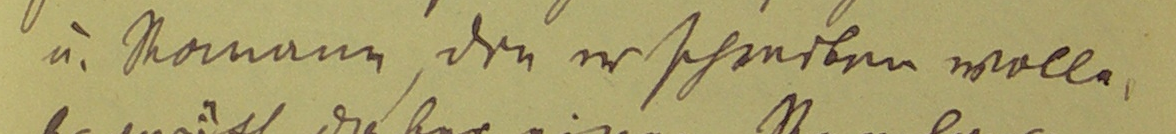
und Romane, die er schreiben wolle.
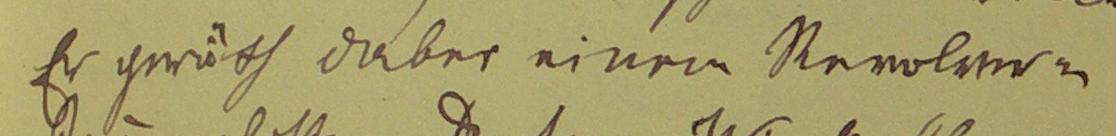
Er geräth dabei einem Revolver –
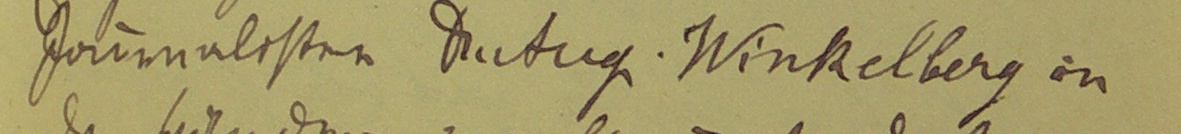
Journalisten Dr. Aug. Winkelberg in
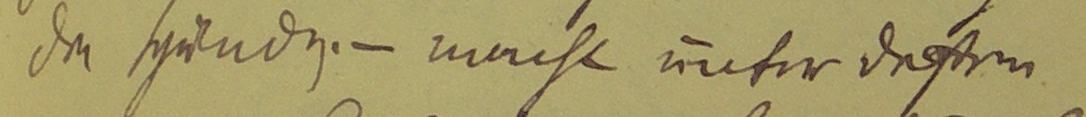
die Hände.- macht unter deßen
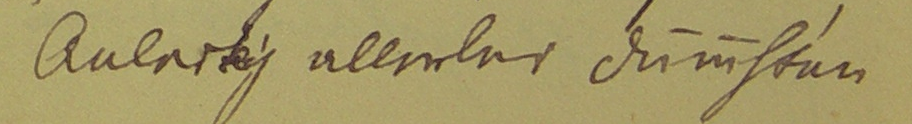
Auleiky.. allerlei Dummheiten
